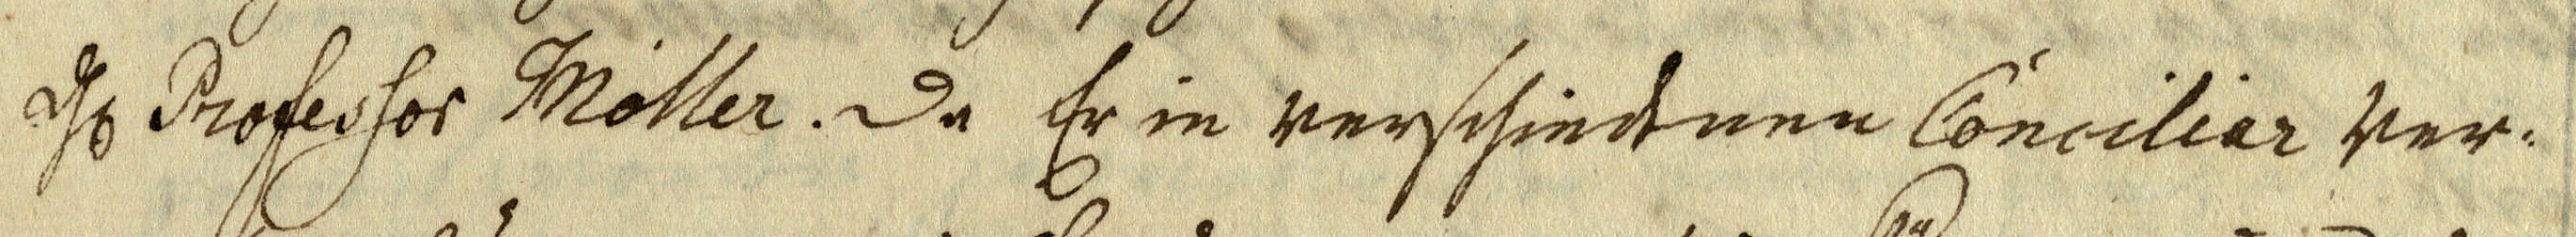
dh Professor Möller. Da Er in verschiedenen Conciliar Ver¬
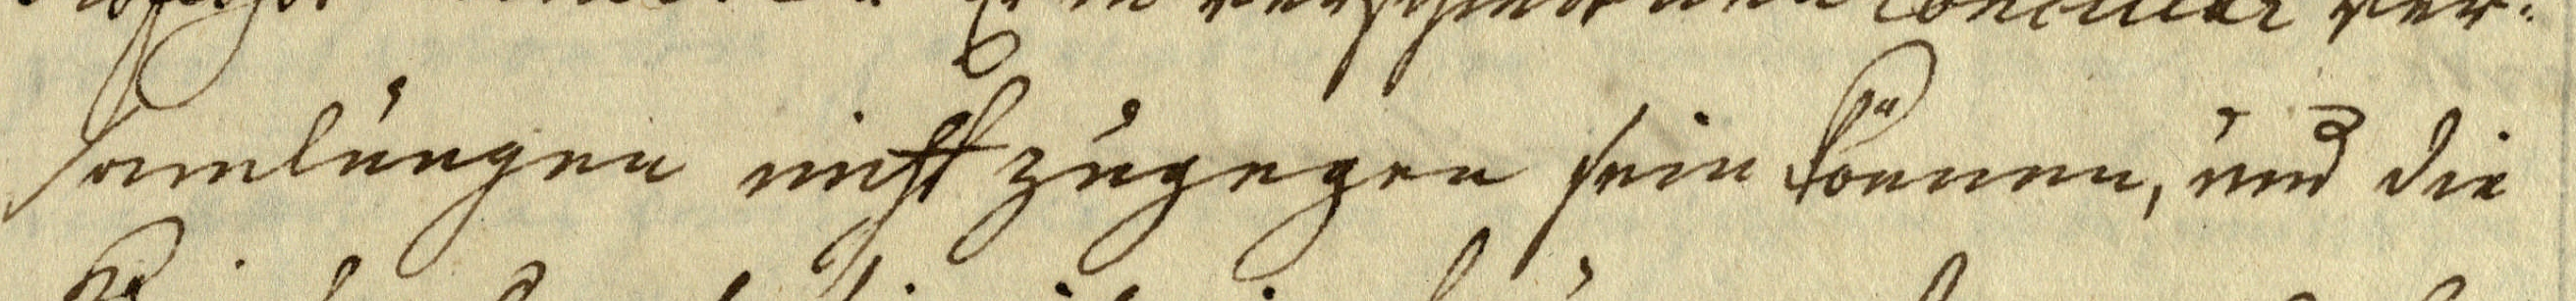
samlungen nicht zugegen sein können, und die
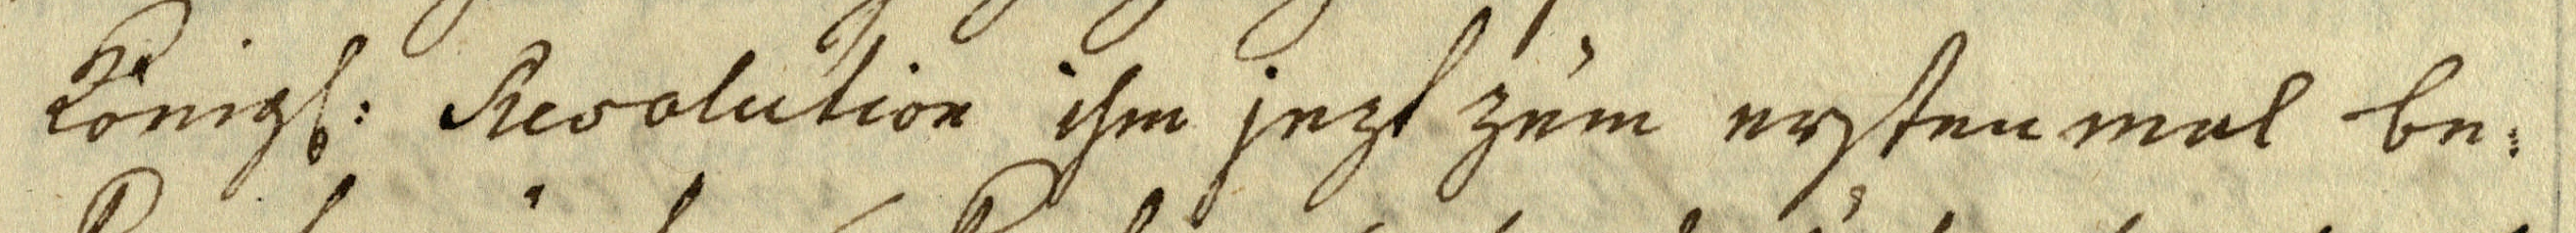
Königl: Resolution ihm jezt zum ersten mal be¬
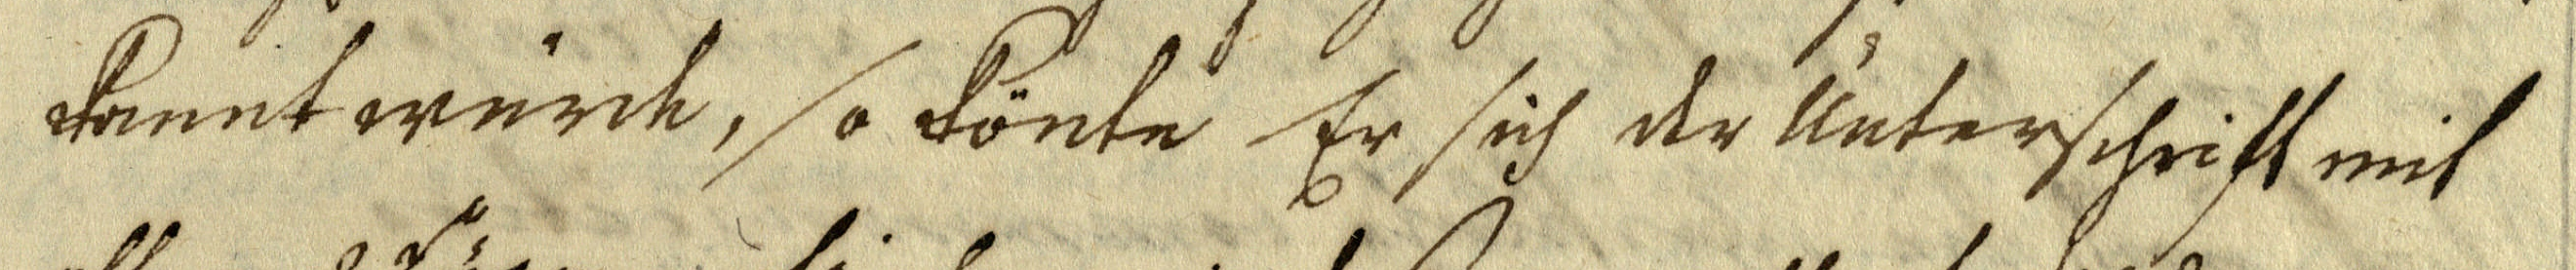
kannt würde, so könte Er sich der Unterschrift mit
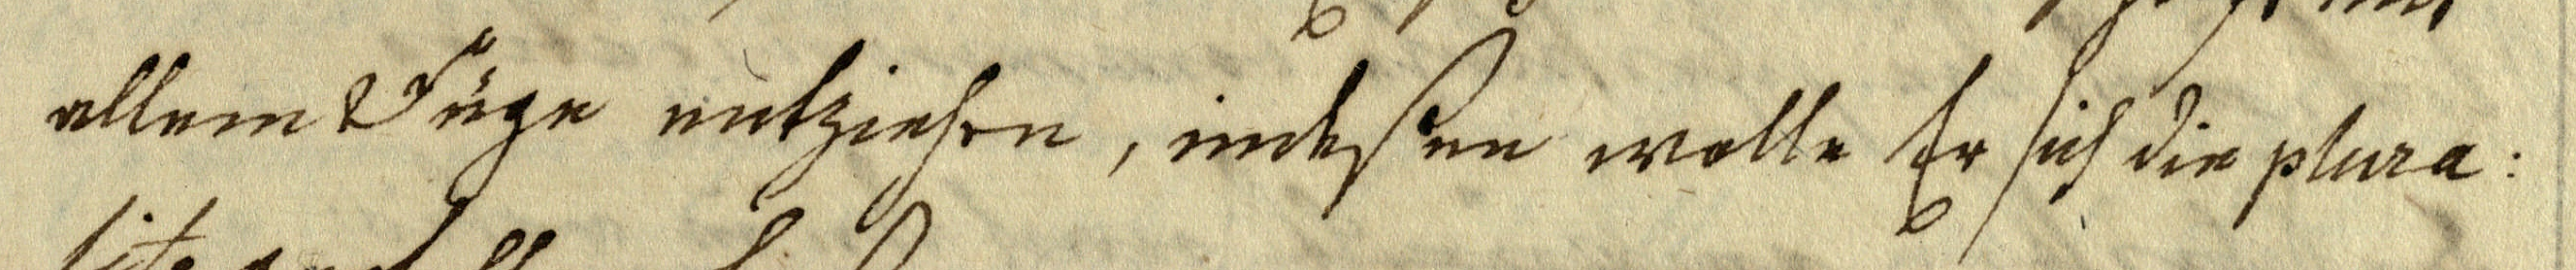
allem Fuge entziehen, indeßen wolle Er sich die plura¬
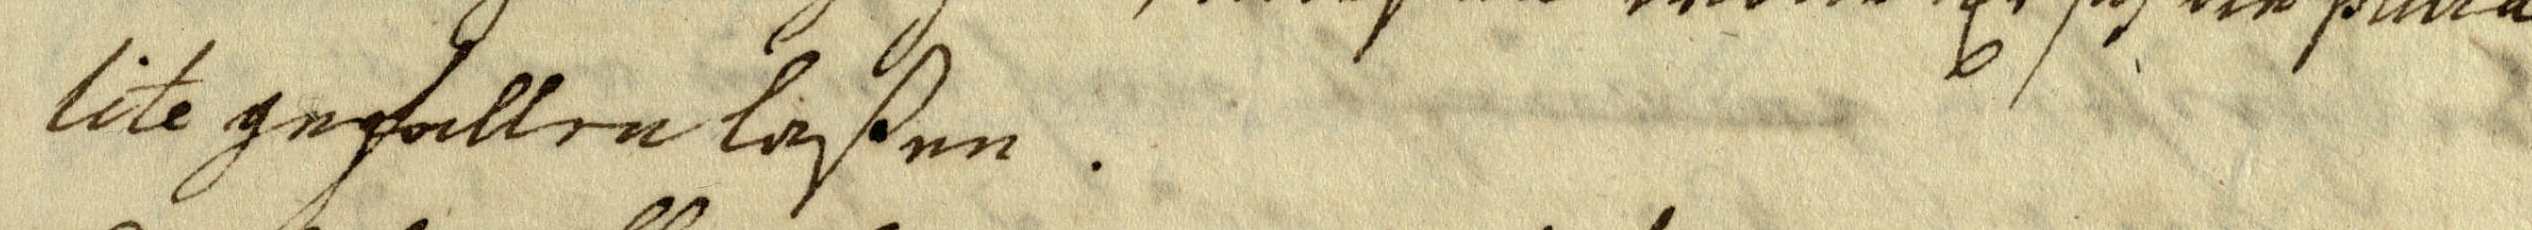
lite gefallen laßen.
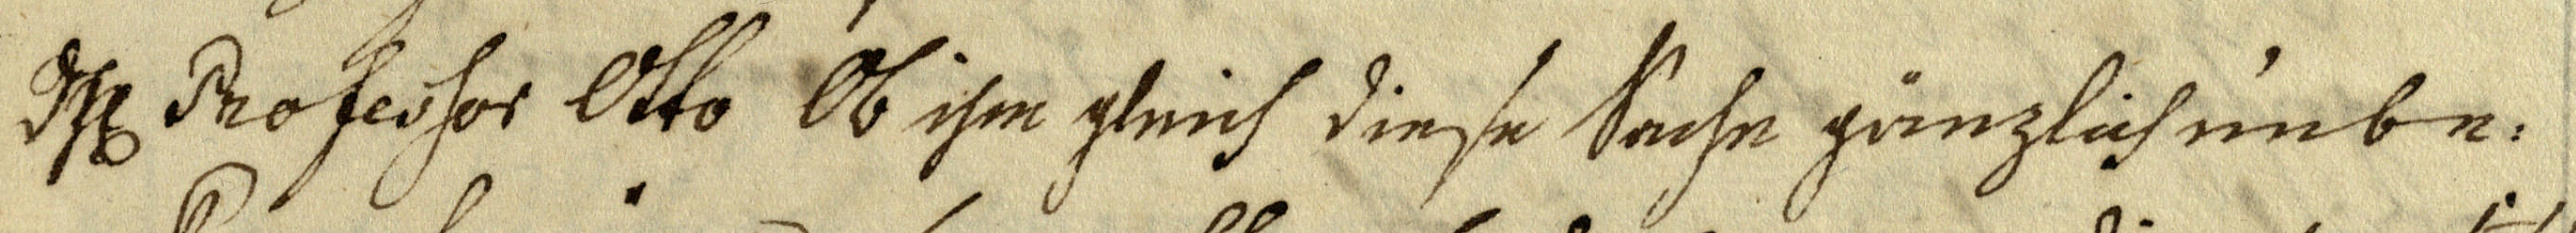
dh Professor Otto Ob ihm gleich diese Sache gänzlich unbe¬
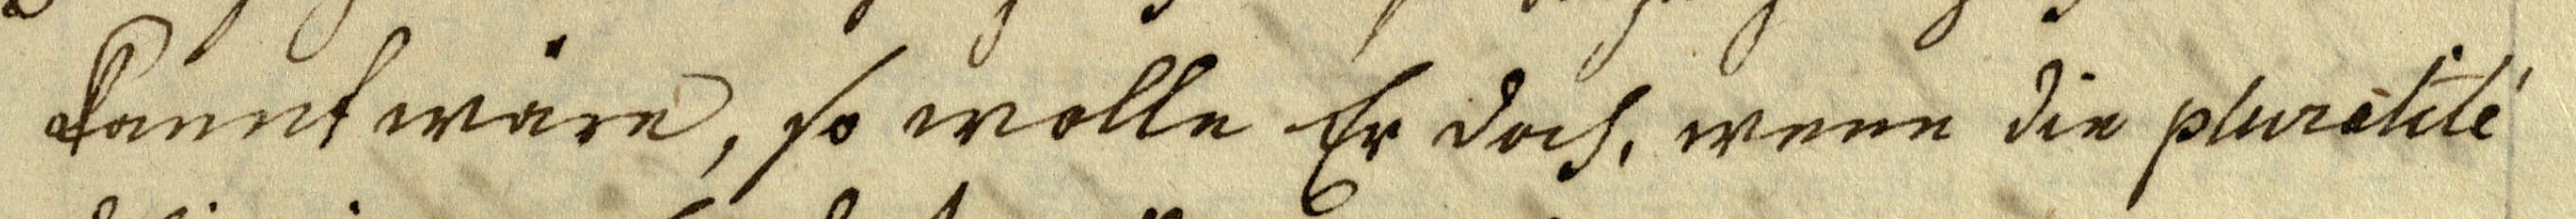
kannt wäre, so wolle Er doch, wenn die pluralité
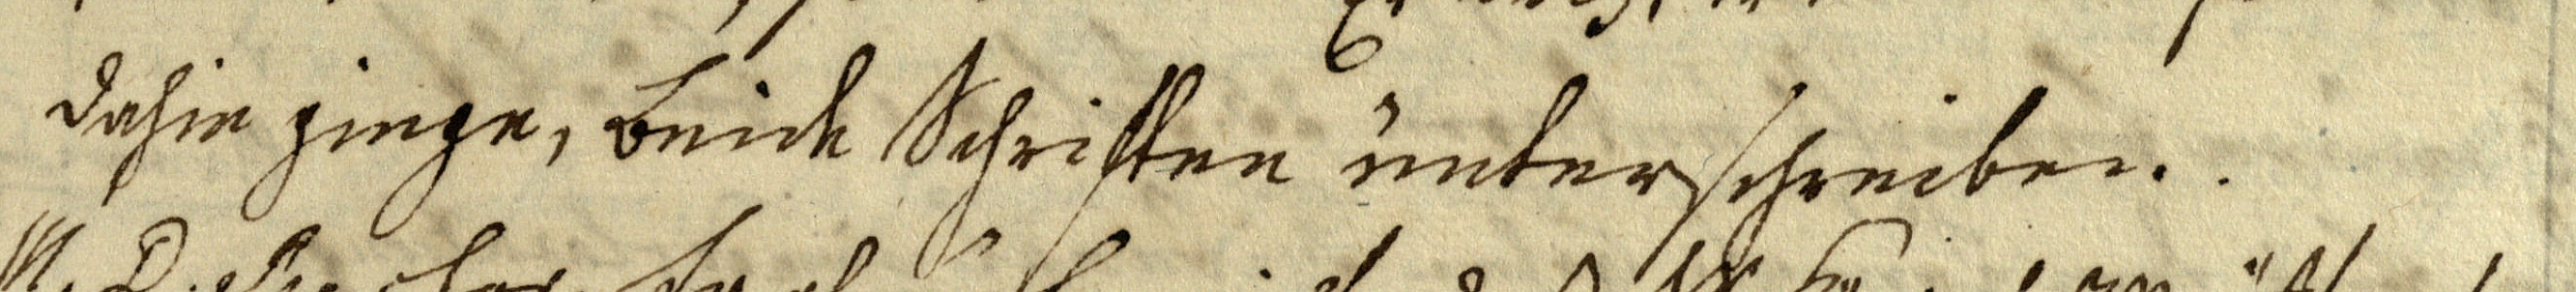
dahin ginge, beide Schriften unterschreiben.
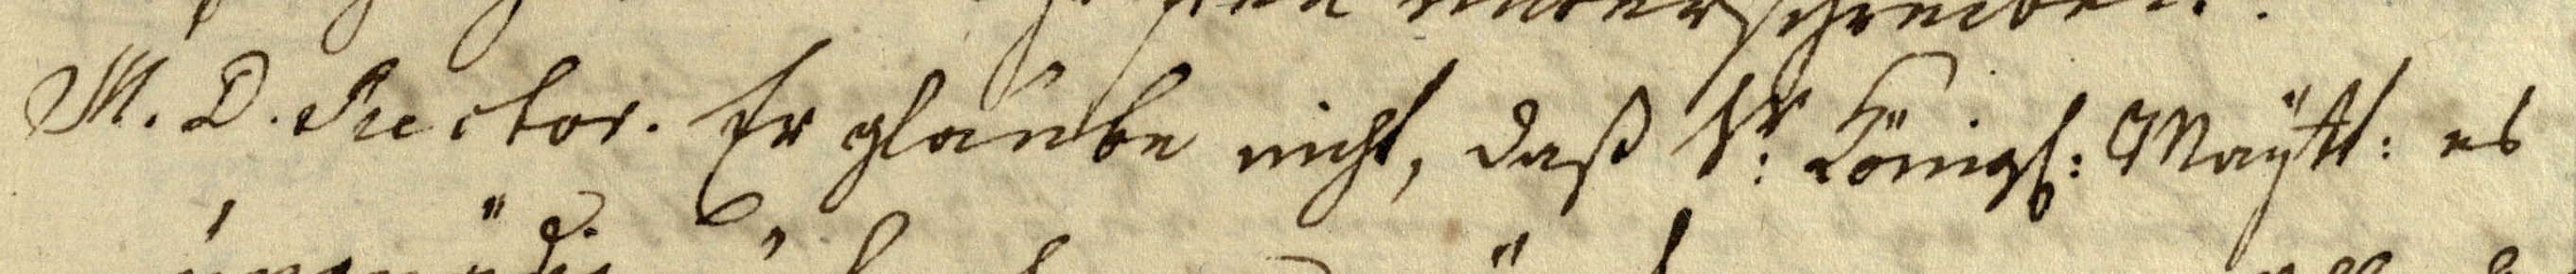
M. D. Rector. Er glaube nicht, daß Sr: Königl: Maÿst: es
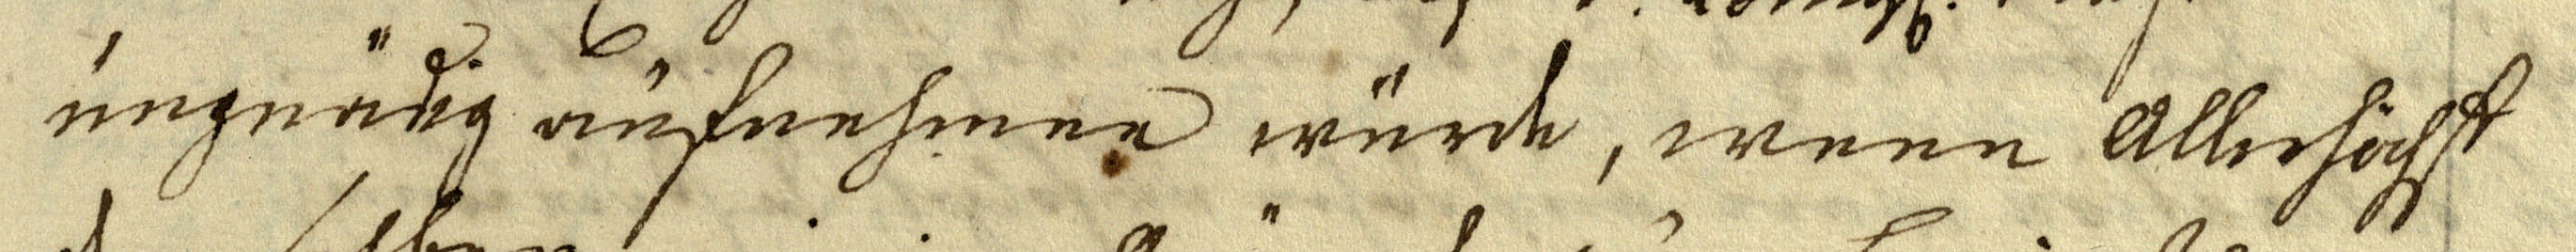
ungnädig aufnehmen würde, wenn Allerhöchst
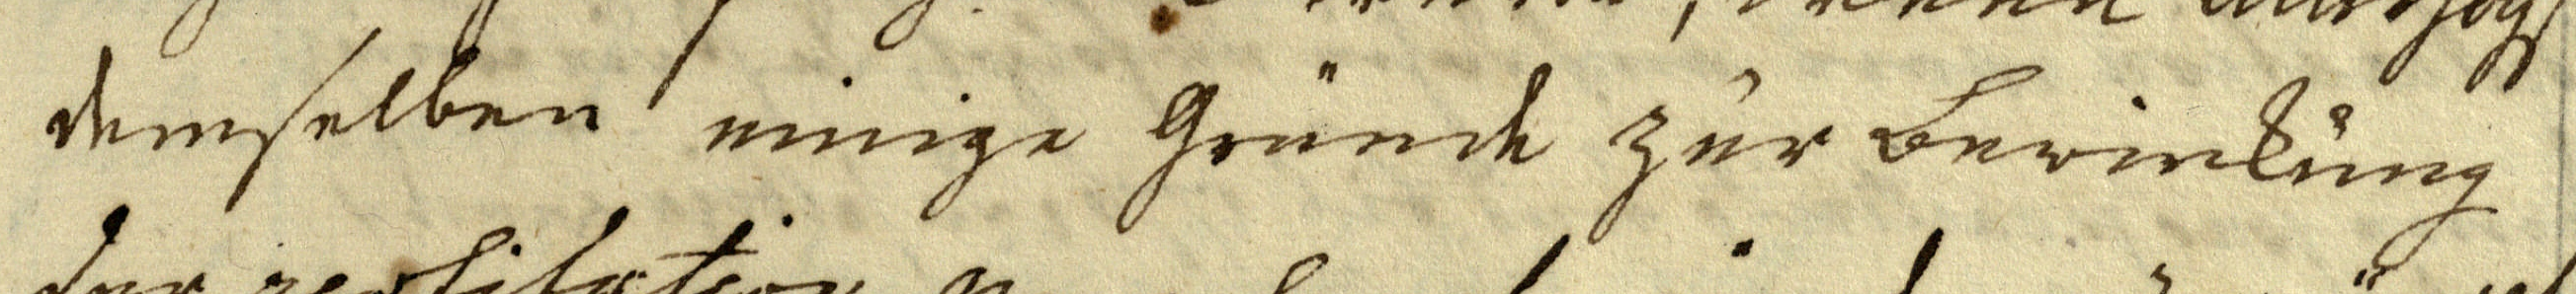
demselben einige Gründe zur Bewirckung
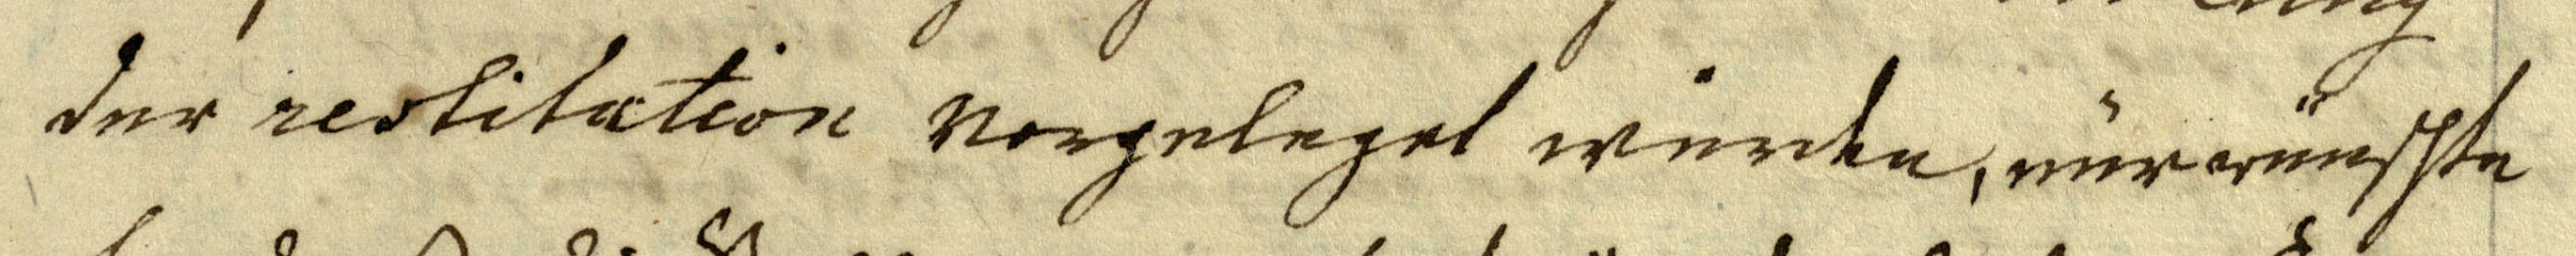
der restitution vorgeleget würden, nur wünschte
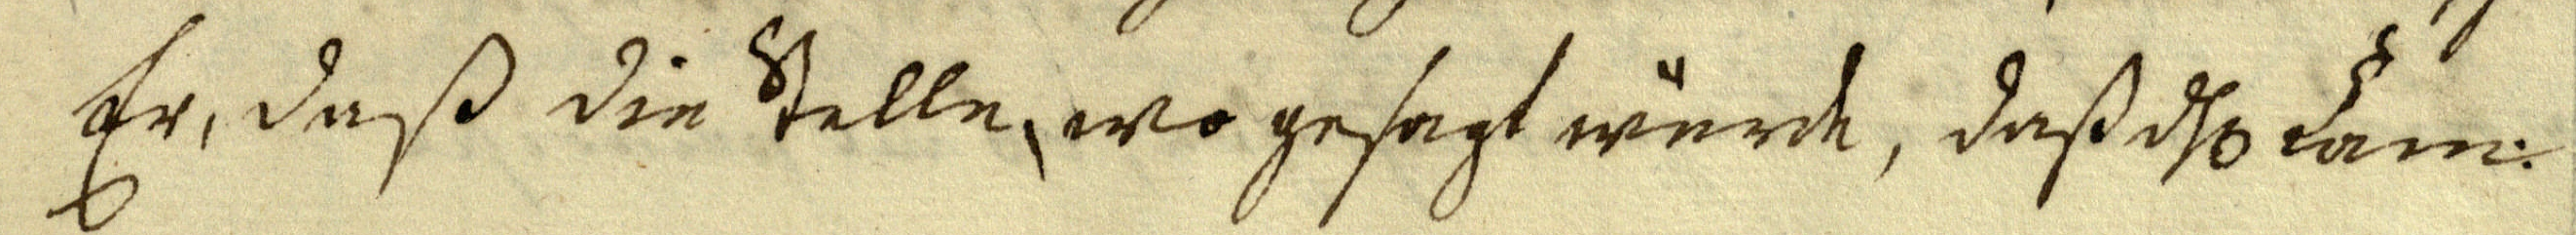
Er, daß die Stelle, wo gesagt würde, daß dh Cam:
